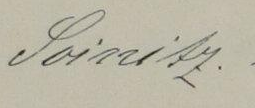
Soinitz.
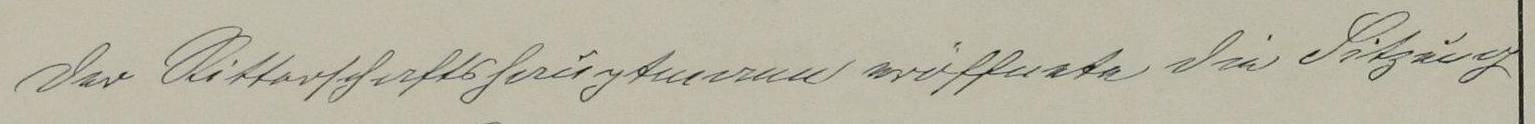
Der Ritterschaftshauptmann eröffnete die Sitzung
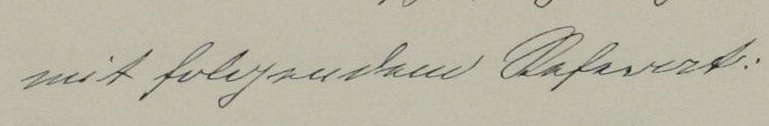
mit folgendem Referat:
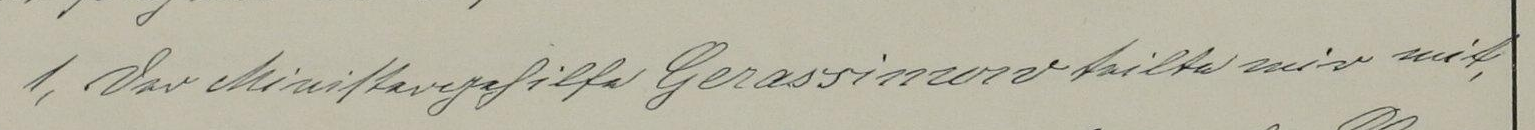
1. Der Ministergehilfe Gerassimow teilte mir mit,
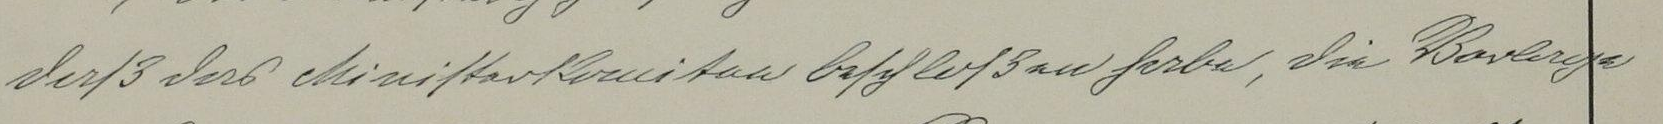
daß das Ministerkomitee beschloßen habe, die Vorlage
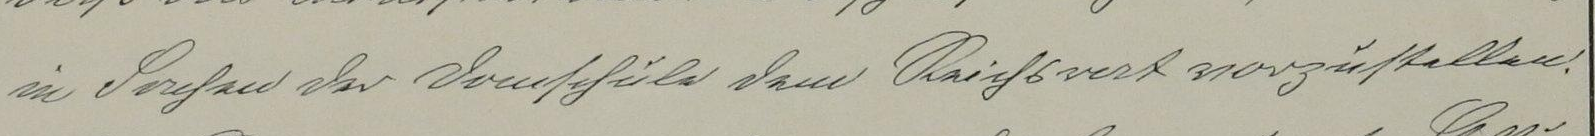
in Sachen der Domschule dem Reichsrat vorzustellen.
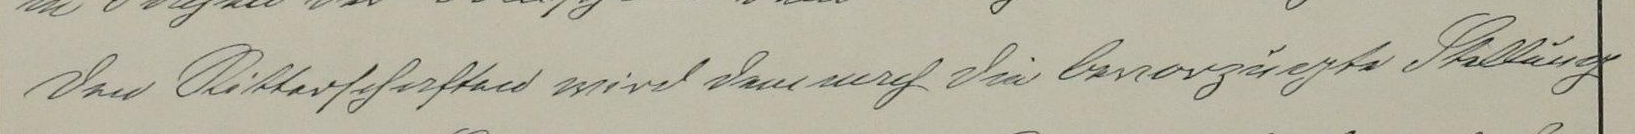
Den Ritterschaften wird demnach die bevorzugte Stellung
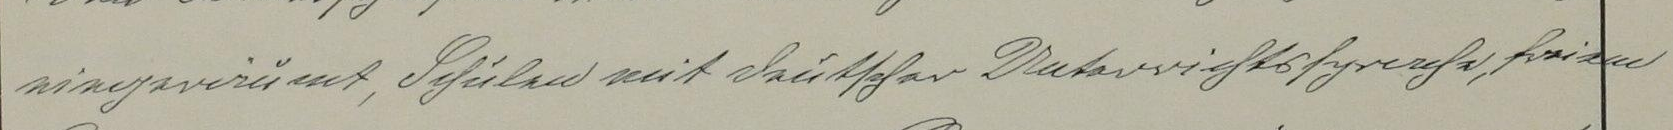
eingeräumt, Schulen mit deutscher Unterrichtssprache, freiem
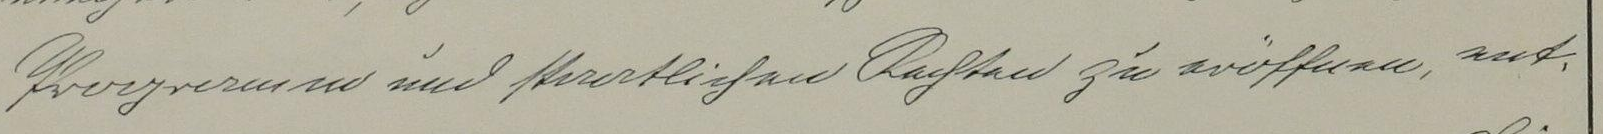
Programm und staatlichen Rechten zu eröffnen ent-
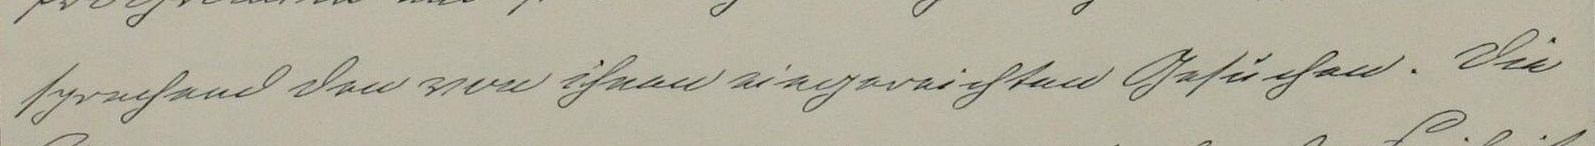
sprechend den von ihnen eingereichten Gesuchen. Die
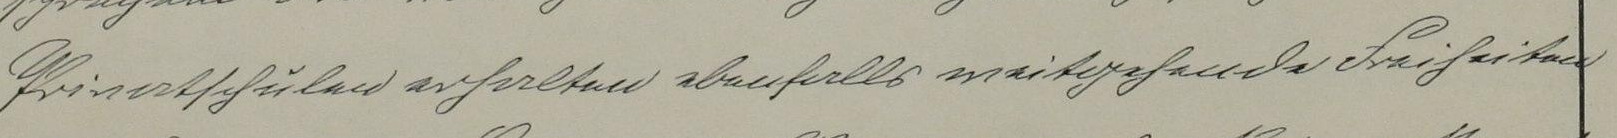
Privatschulen erhalten ebenfalls weitgehende Freiheiten
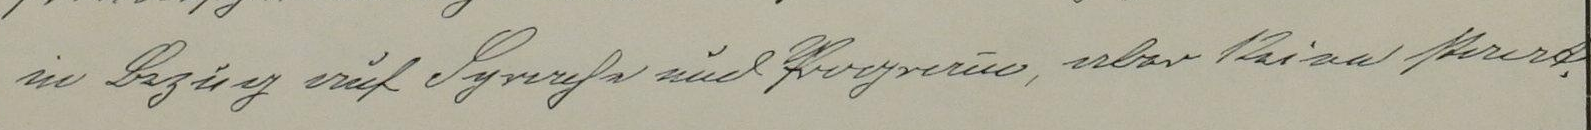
in Bezug auf Sprache und Programm, aber keine staat-
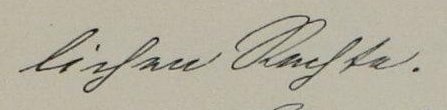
lichen Rechte.
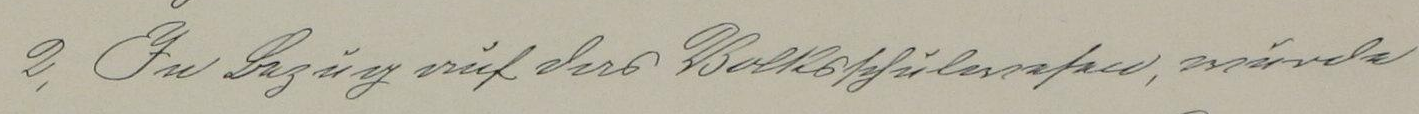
2. In Bezug auf das Volksschulwesen wurde
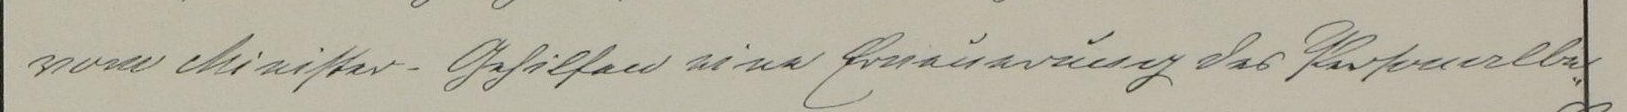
vom Minister-Gehilfen eine Erneuerung des Personalbe-
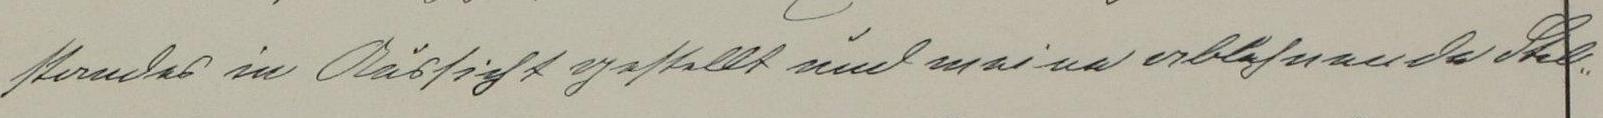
standes in Aussicht gestellt und meine ablehnende Stel-
